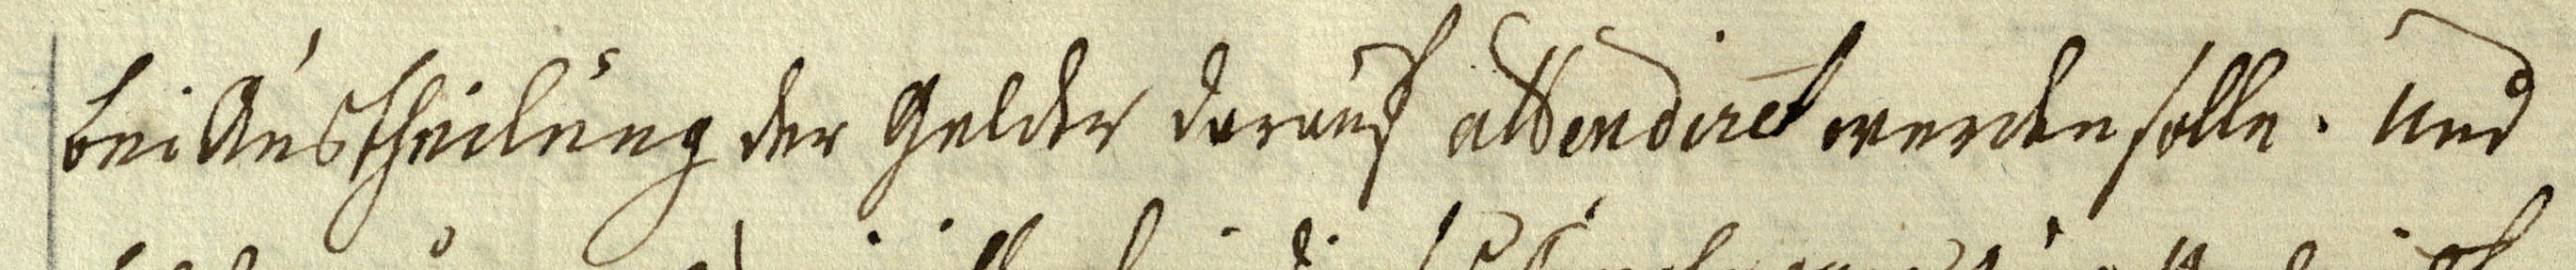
bei Austheilung der Gelder darauf attendiret werden solle. Und
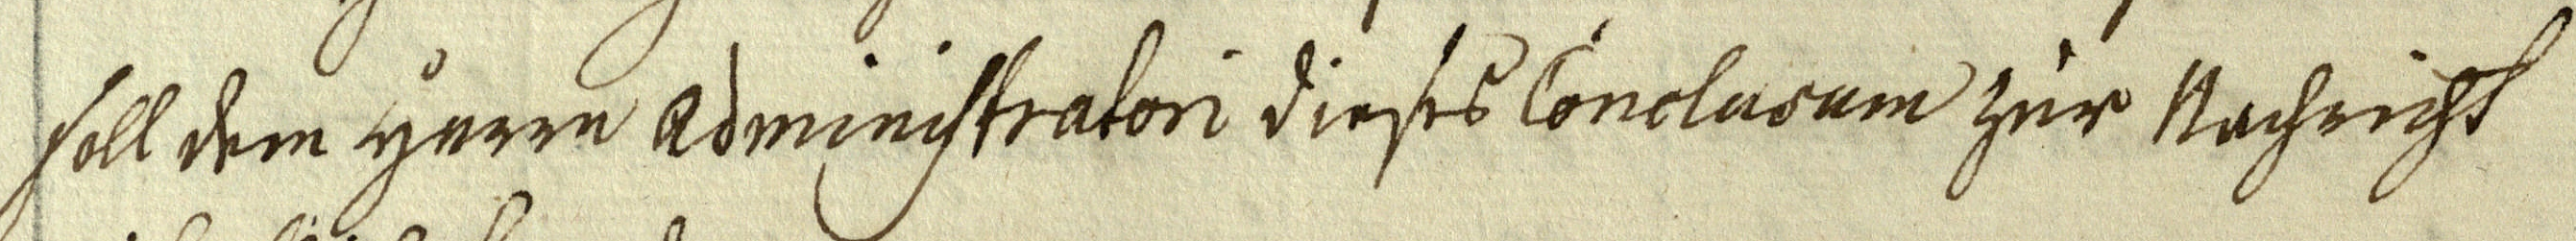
soll dem Herrn Administratori dieses Conclusum zur Nachricht
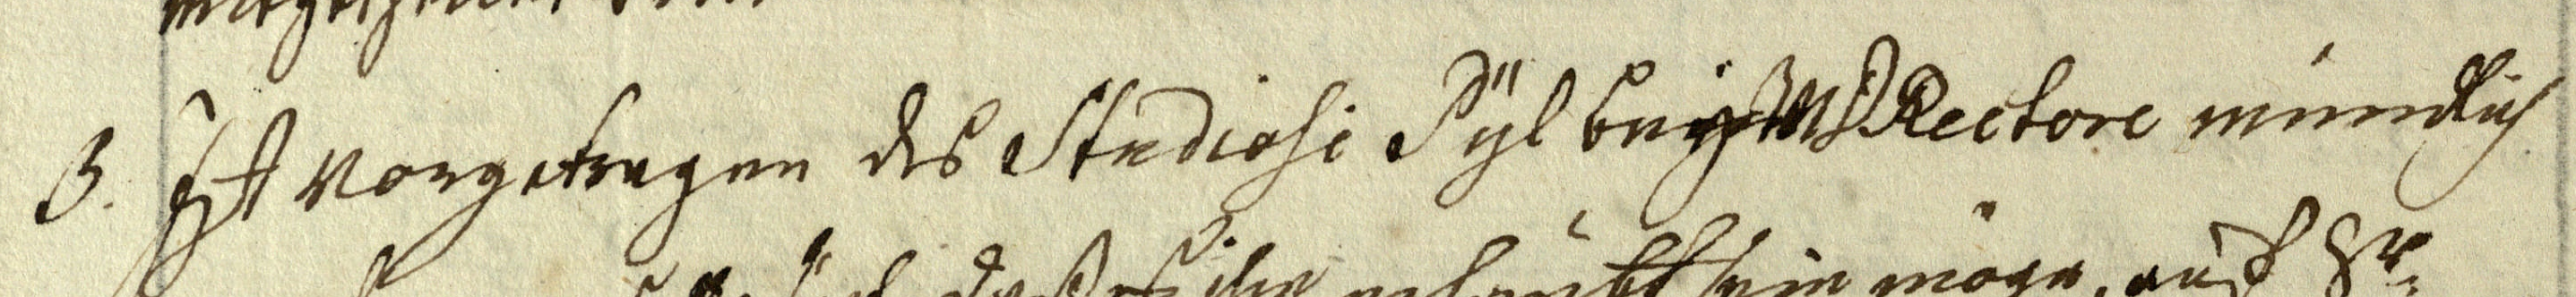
3. Ist vorgetragen des Studiosi Pÿl beÿ M. D. Rectore mündlich
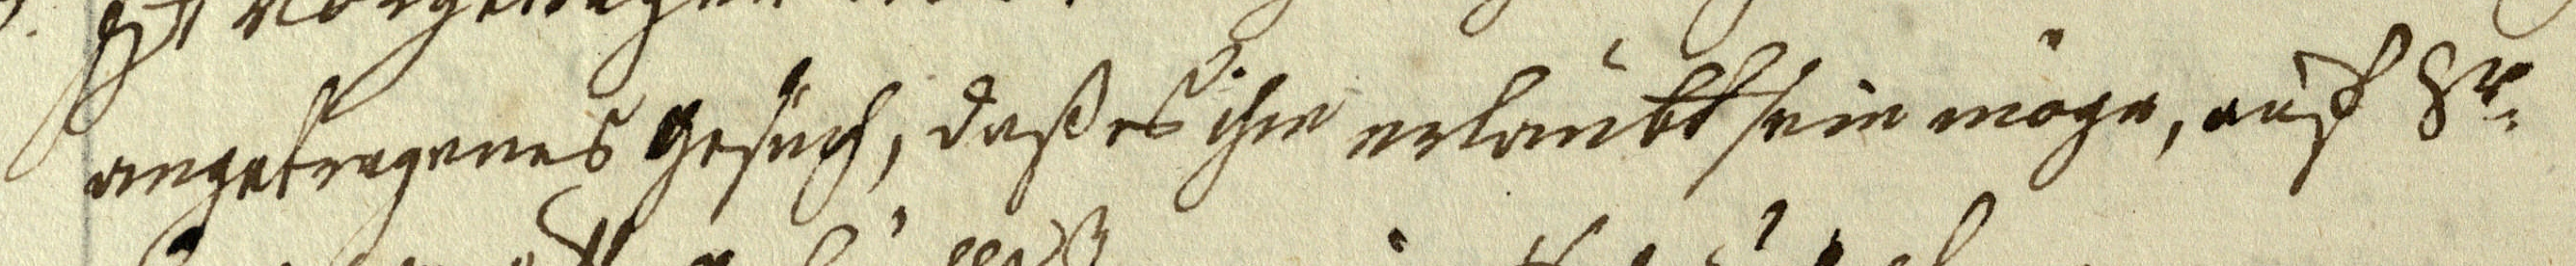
angetragenes Gesuch, daß es ihm erlaubt sein möge, auf Sr.
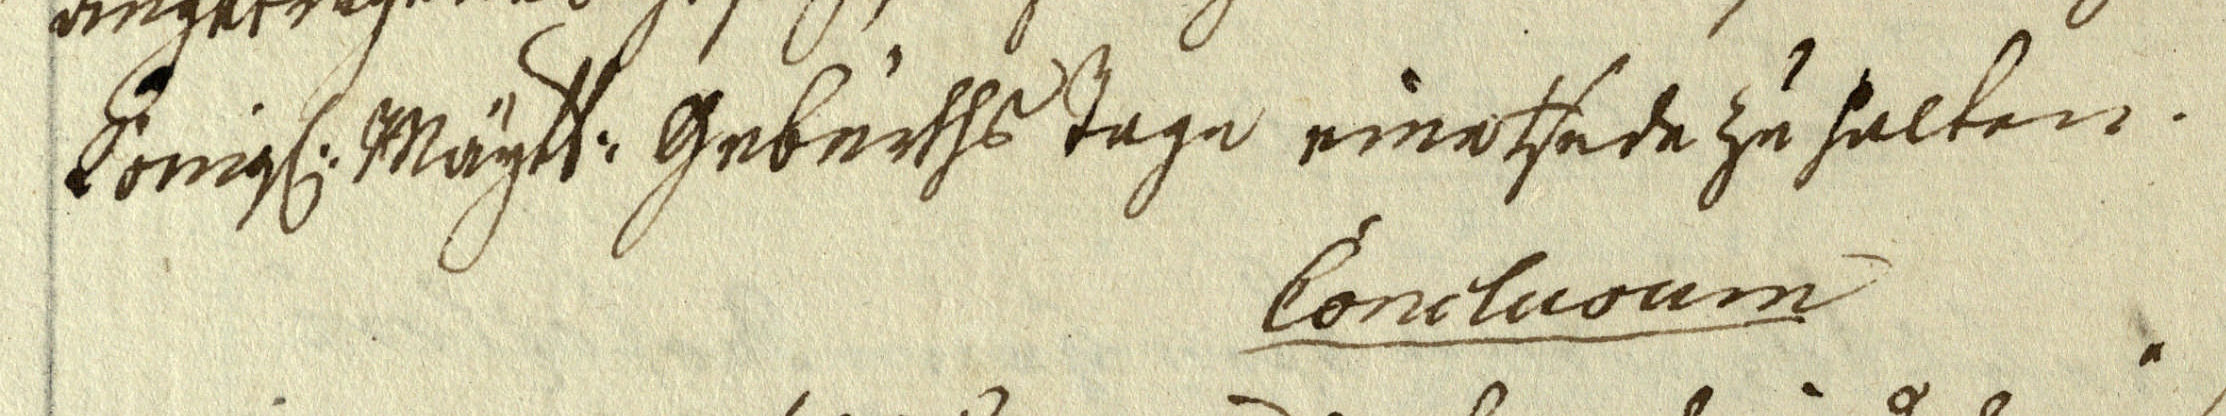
Königl. Maÿtt. Geburthstage eine Rede zu halten.
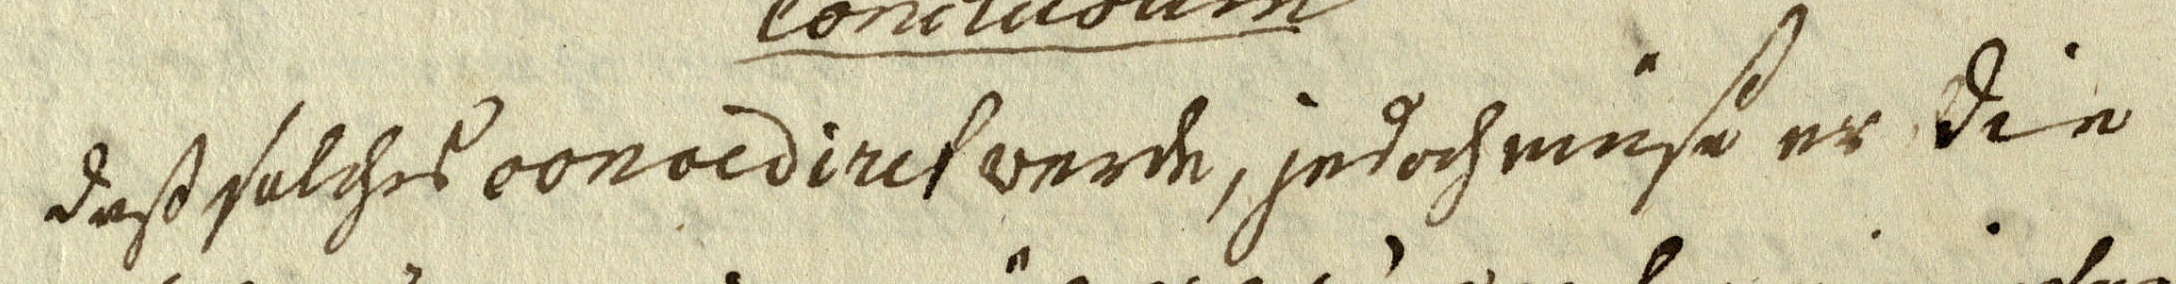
daß solches concediret werde, jedoch müse er die
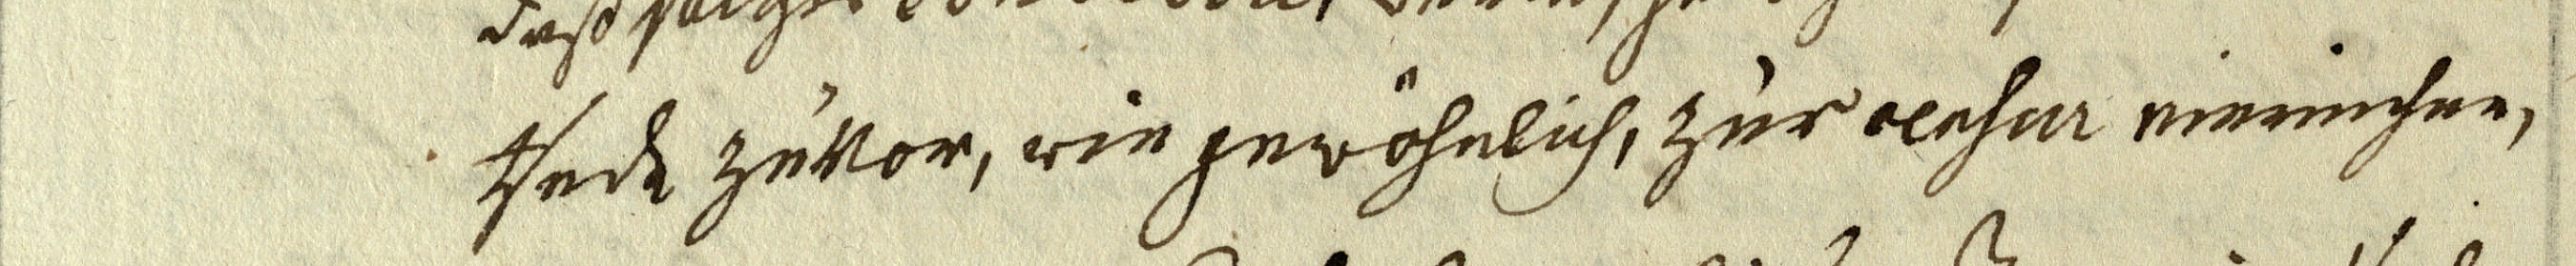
Rede zuvor, wie gewöhnlich, zur censur einreichen,
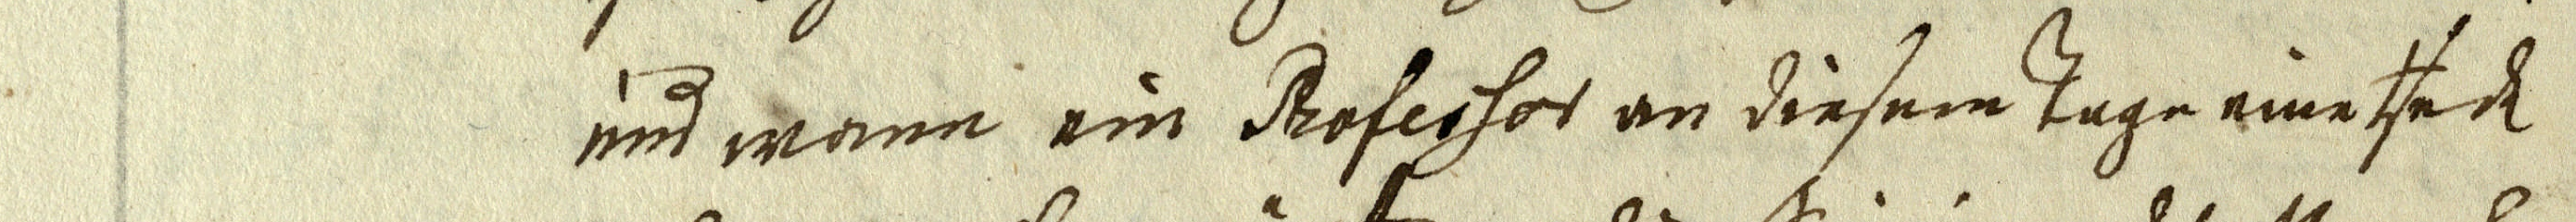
und wann ein Professor an diesem Tage eine Rede
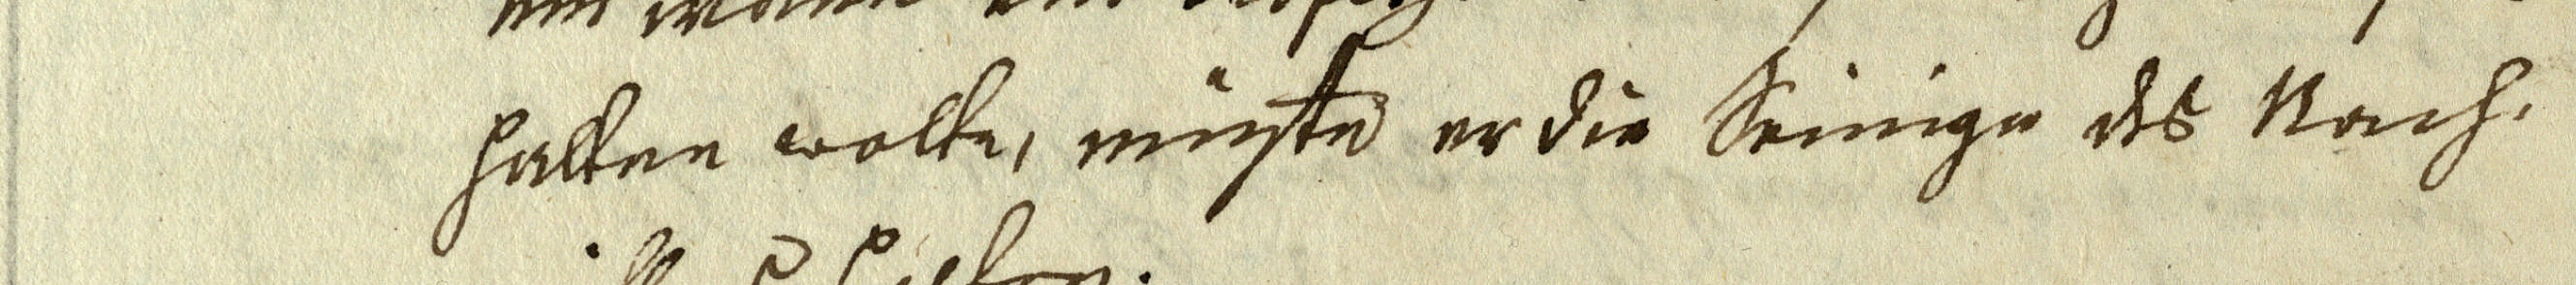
halten wolte, müste er die Seinige des Nach¬
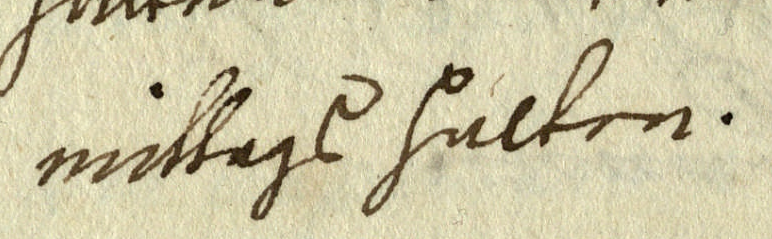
mittags halten.
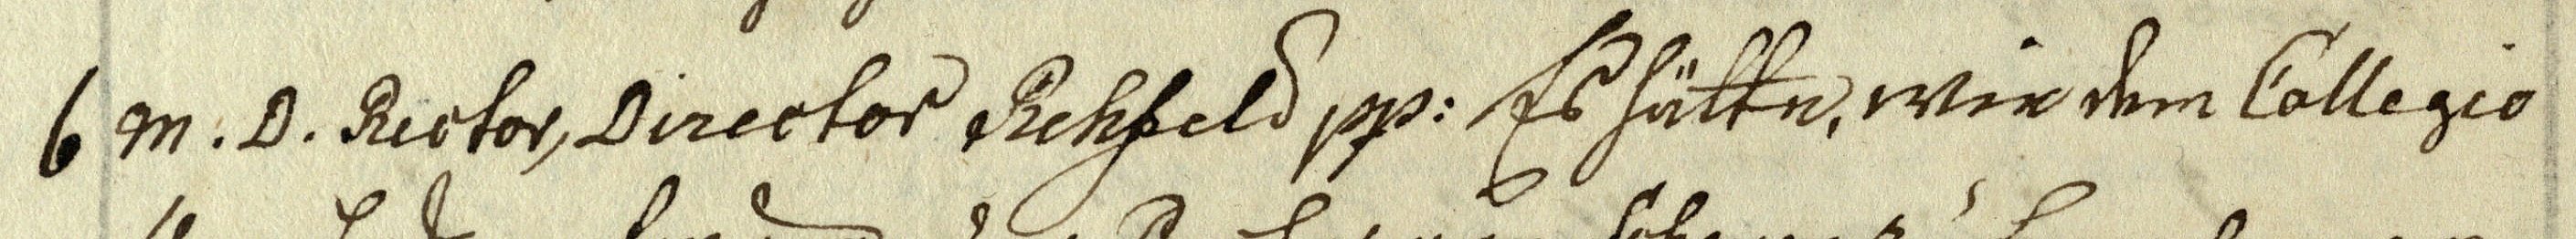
6. M. D. Rector, Director Rehfeld pp. Es hätte, wie dem Collegio
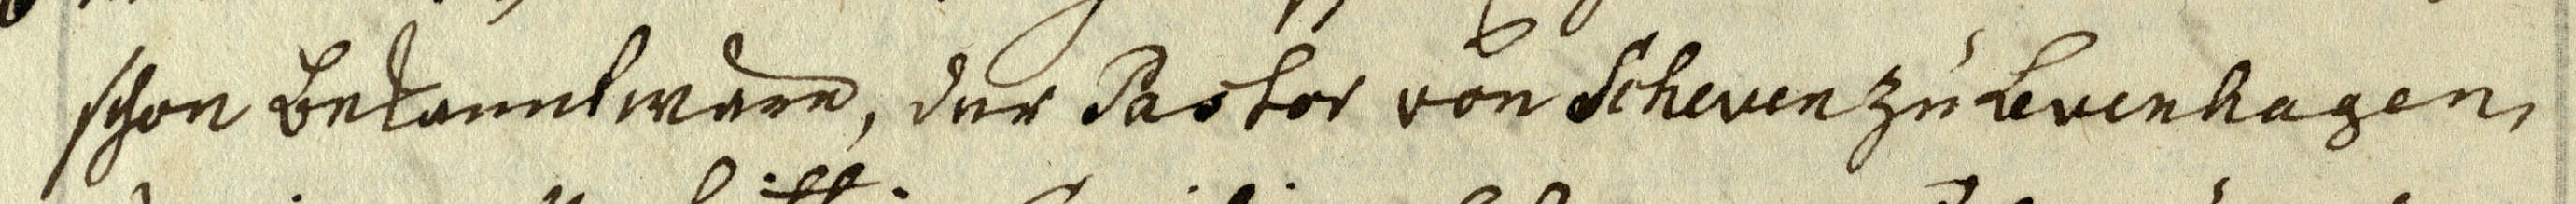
schon bekannt wäre, der Pastor von Scheven zu Levenhagen
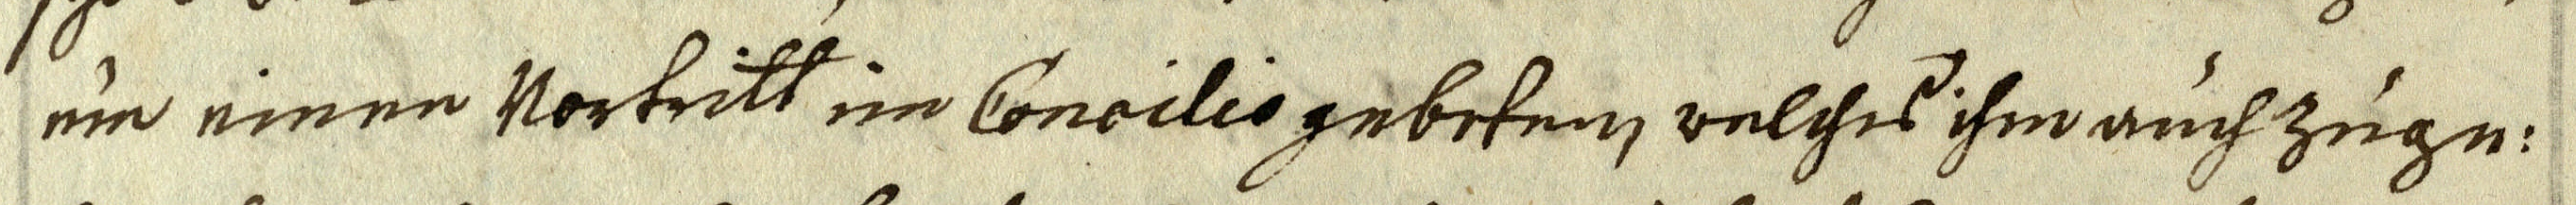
um einen Vortritt im Concilio gebeten, welches ihm auch zuge¬
